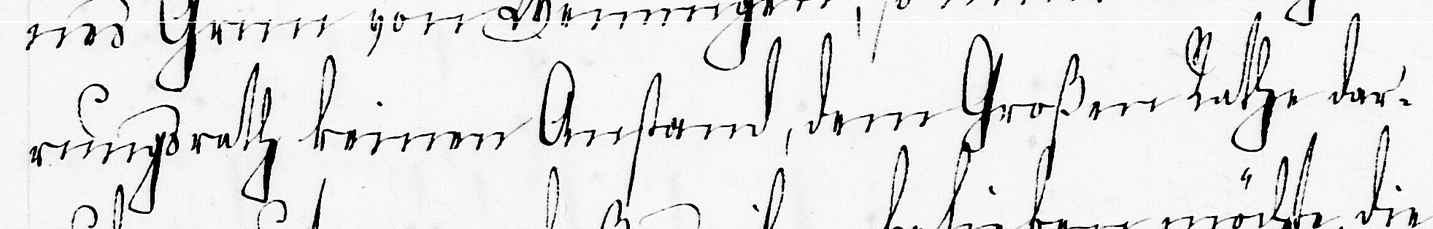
rungsrath keinen Anstand, dem Großen Rathe dar¬
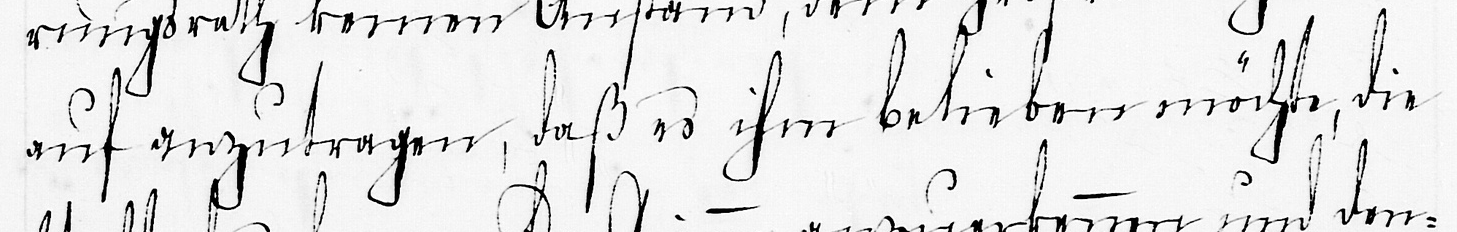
auf anzutragen, daß es ihm belieben möchte, die
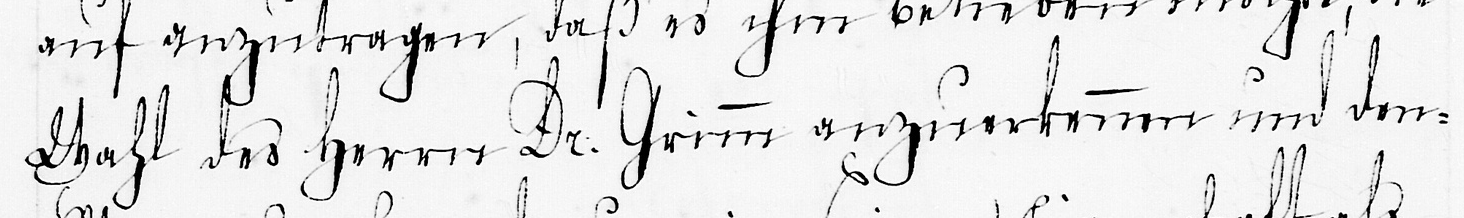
Wahl des Herrn Dr. Grimm anzuerkennen und den¬
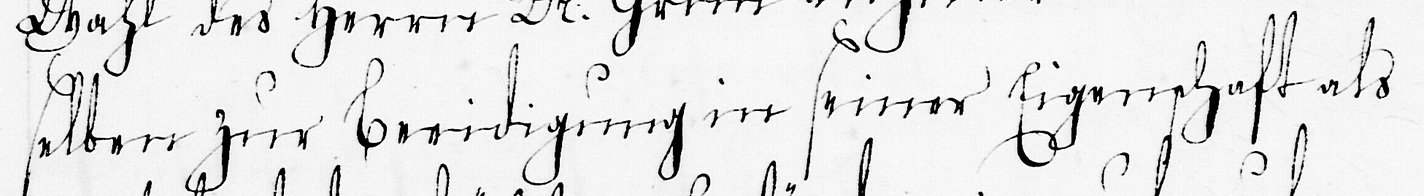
selben zur Beeidigung in seiner Eigenschaft als
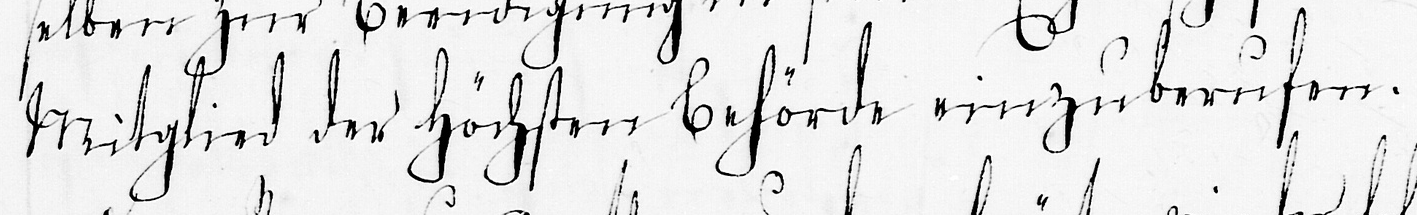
Mitglied der Höchsten Behörde einzuberufen.
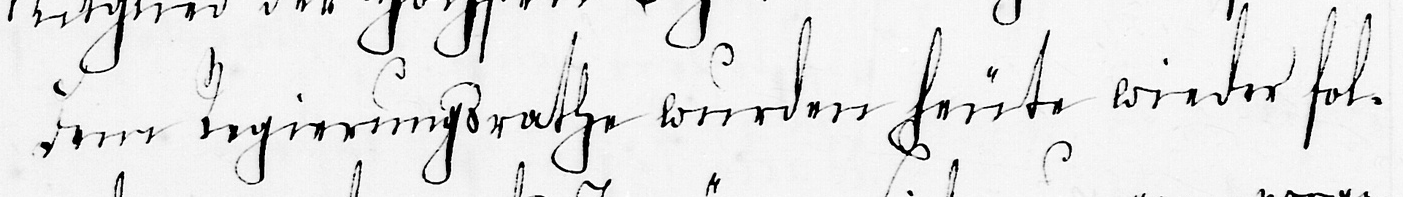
Dem Regierungsrathe wurden heute wieder fol¬
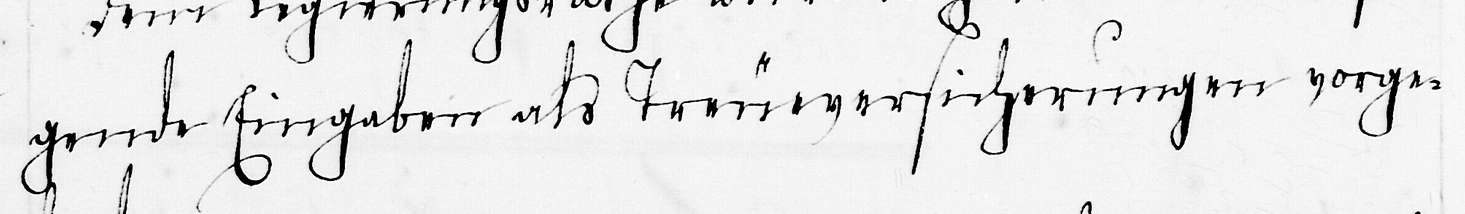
gende Eingaben als Treueversicherungen vorge¬
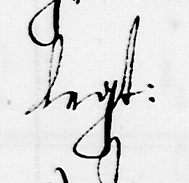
legt:
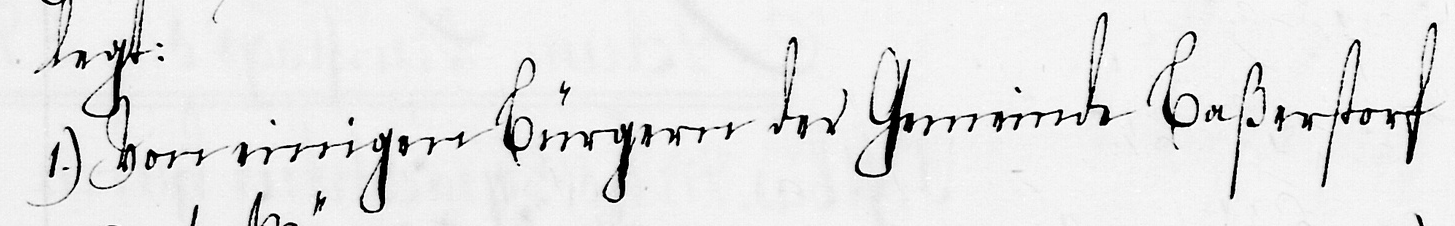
1.) Von einigen Bürgern der Gemeinde Baßerstorf
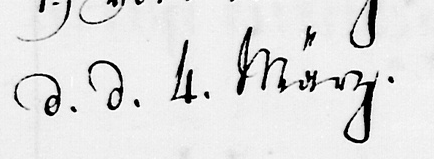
d. d. 4. März.
